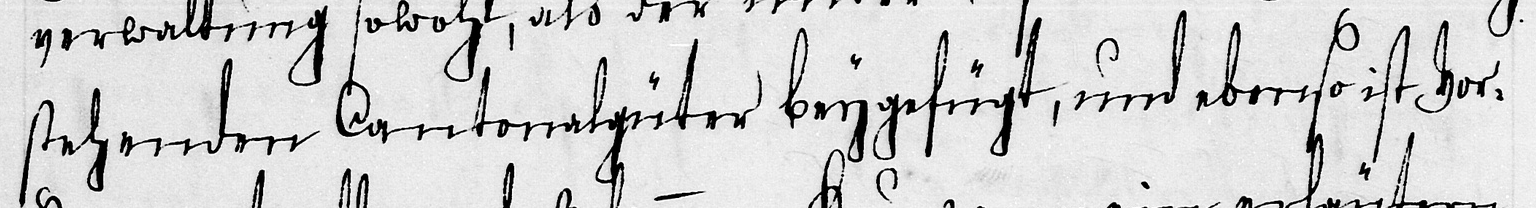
stehenden Cantonalgüter beygefügt, und ebenso ist Vor¬
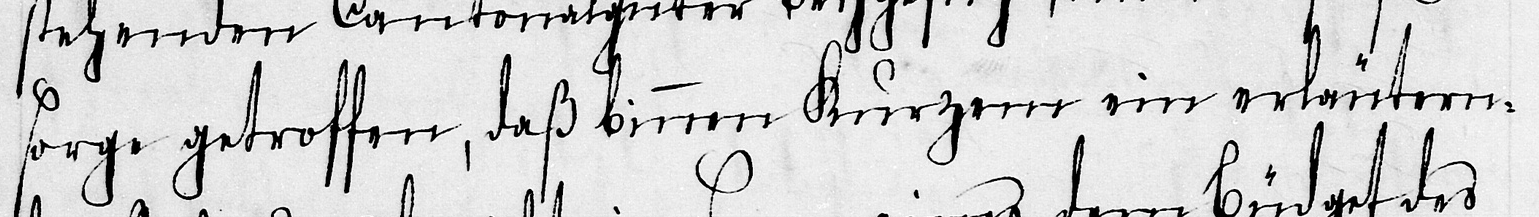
sorge getroffen, daß binnen Kurzem ein erläutern¬
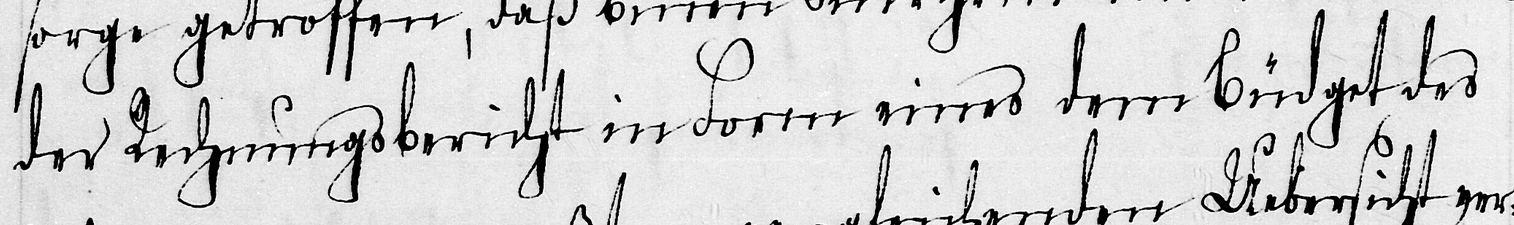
der Rechnungsbericht in Form eines dem Büdget des
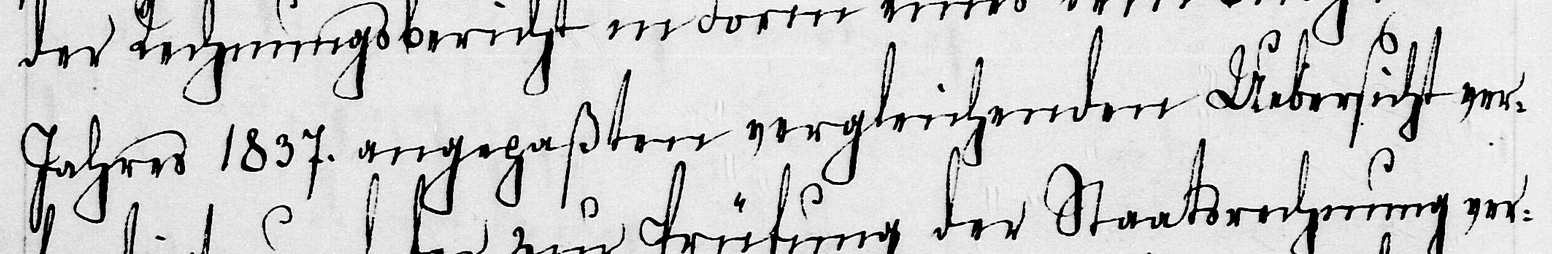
Jahres 1837. angepaßten vergleichenden Uebersicht ver¬
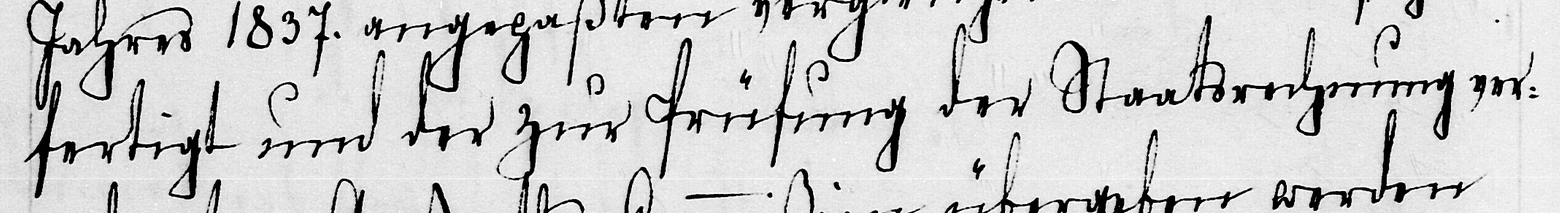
fertigt und der zur Prüfung der Staatsrechnung ver¬
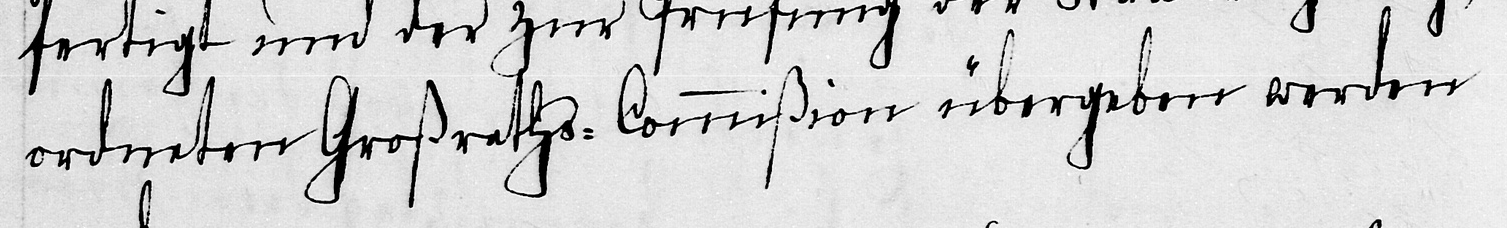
ordneten Großraths-Commißion übergeben werden
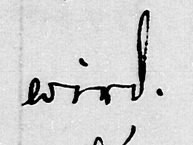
wird.
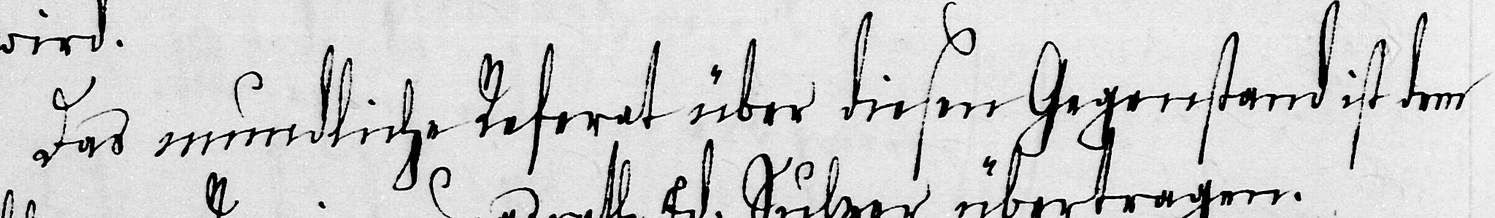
Das mundliche Referat über diesen Gegenstand ist dem
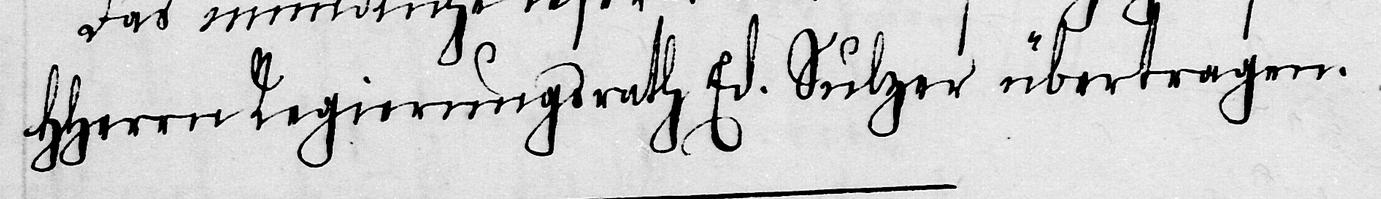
HHerrn Regierungsrath Ed. Sulzer übertragen.
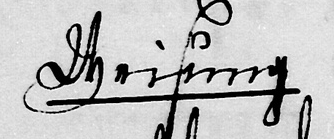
Weisung
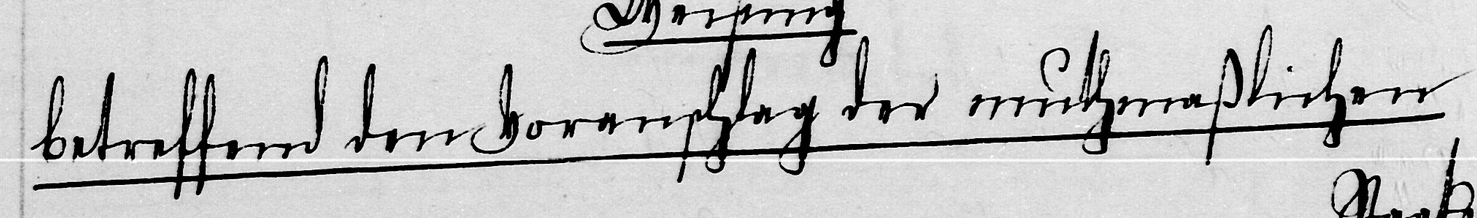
betreffend den Voranschlag der muthmaßlichen
